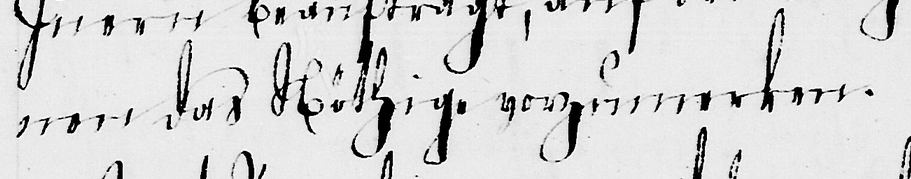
nen das Nöthige vorzumerken.
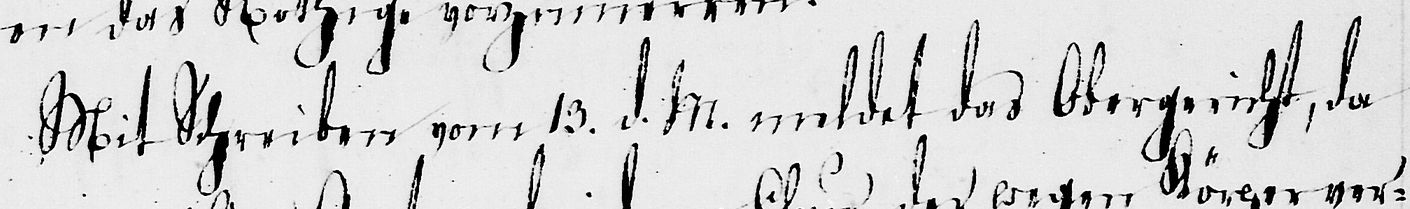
Mit Schreiben vom 13. d. M. meldet das Obergericht, da
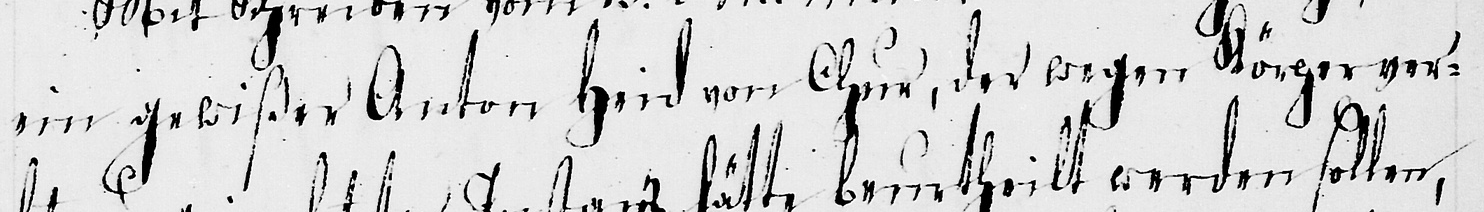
ein gewißer Anton Heid von Chur, der wegen Körperver¬
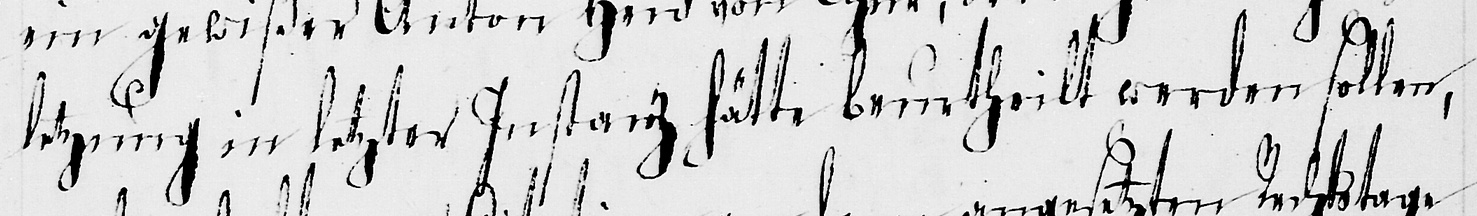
letzung in letzter Instanz hätte beurtheilt werden sollen,
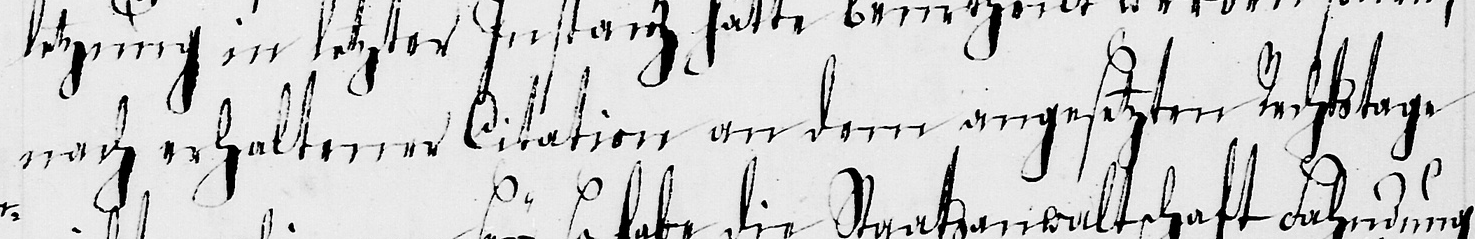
nach erhaltener Citation an dem angesetzten Rechtstage
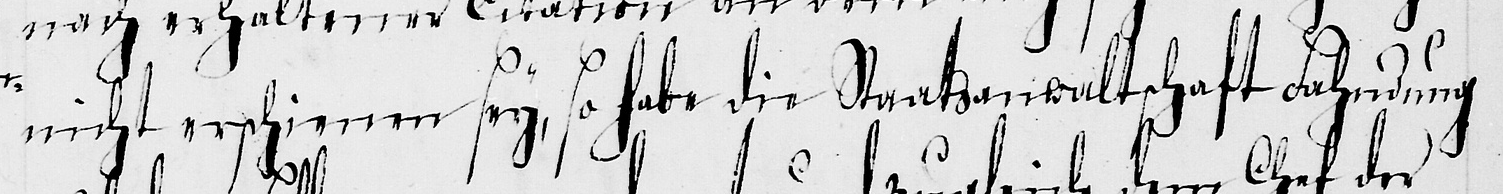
nicht erschienen sey, so habe die Staatsanwaltschaft Fahndung
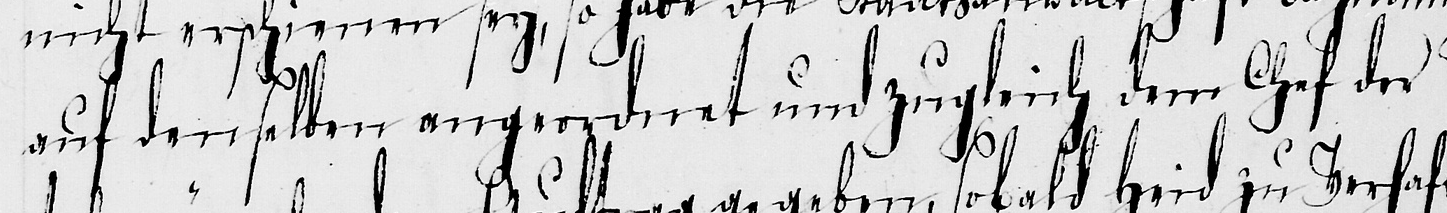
auf denselben angeordnet und zugleich dem Chef der
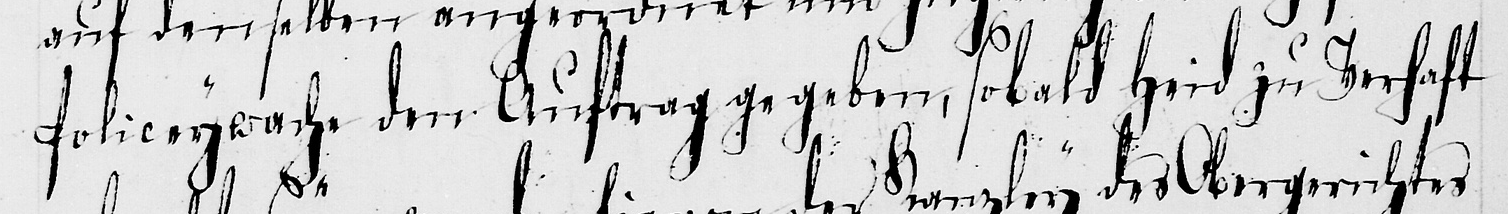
Policeywache den Auftrag gegeben, sobald Heid zu Verhaft
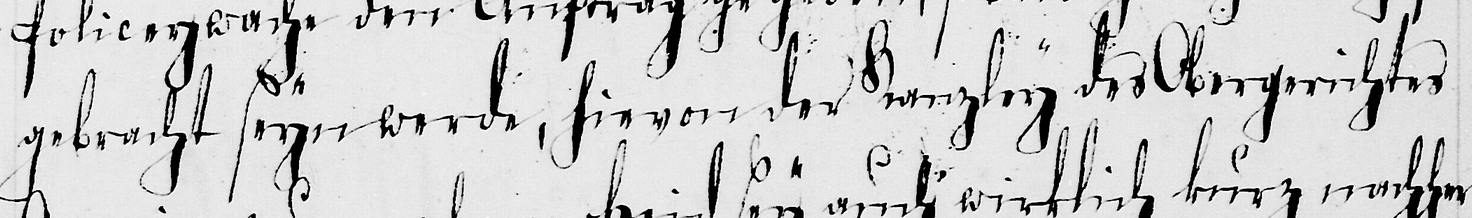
gebracht seyn werde, hievon der Kanzley des Obergerichtes
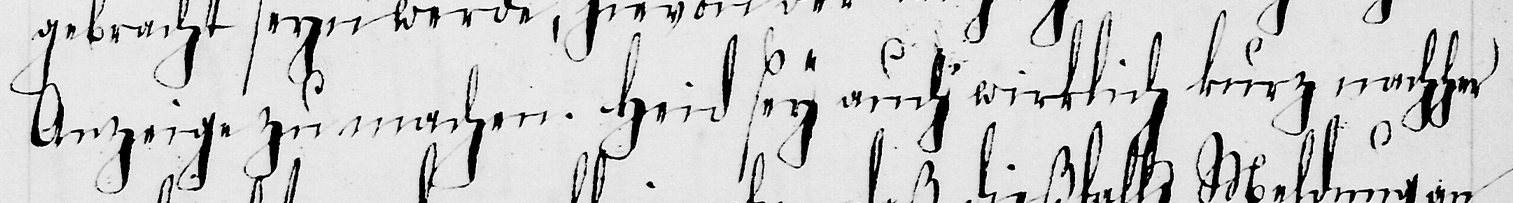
Anzeige zu machen. Heid sey auch wirklich kurz nachher
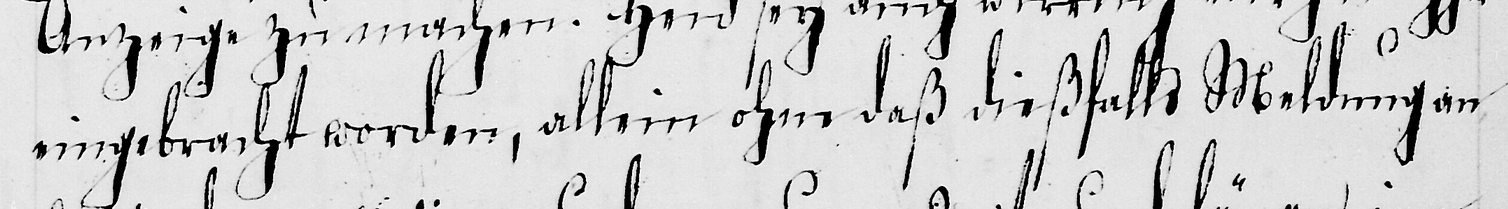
eingebracht worden, allein ohne daß dießfalls Meldung an
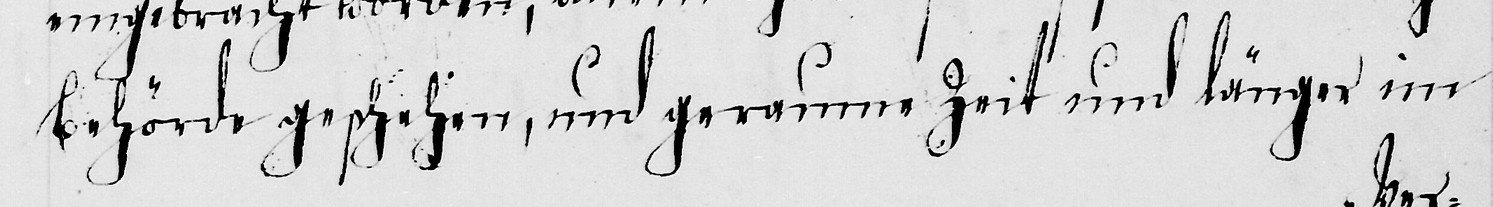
Behörde geschehen, und geraume Zeit und länger im
